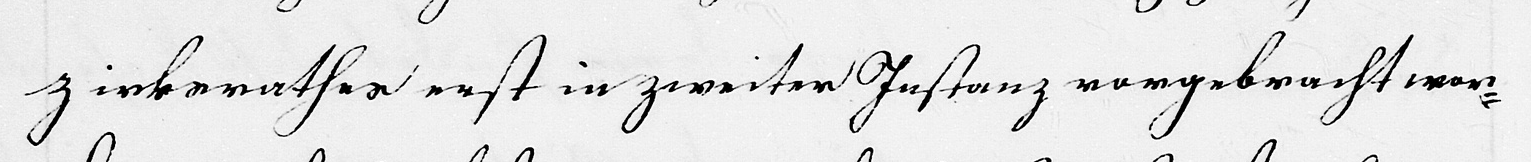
zirksrathes erst in zweiter Instanz vorgebracht wor¬
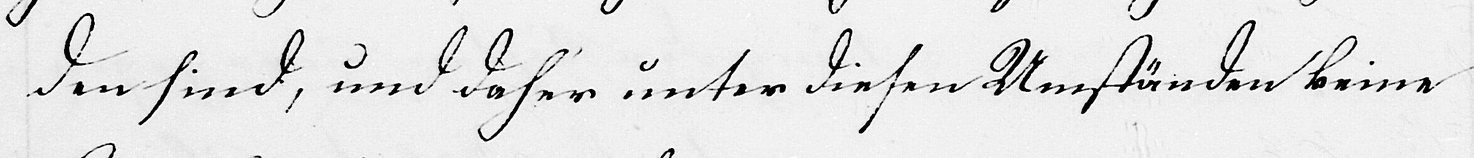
den sind, und daher unter diesen Umständen keine
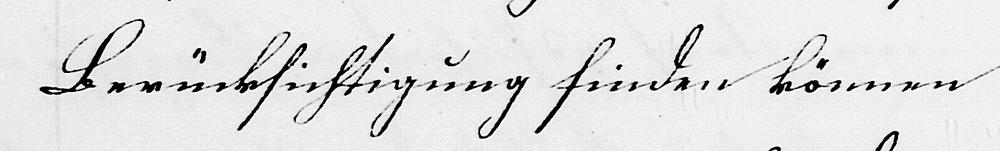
Berücksichtigung finden können
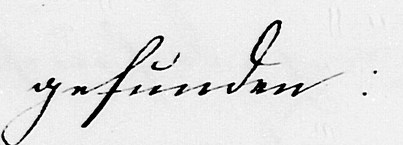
gefunden:
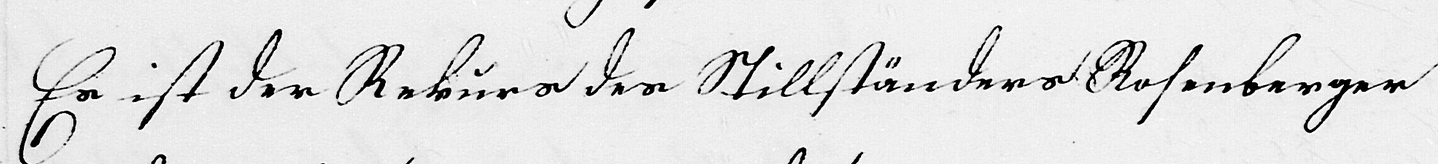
Es ist der Rekurs des Stillständers Rosenberger
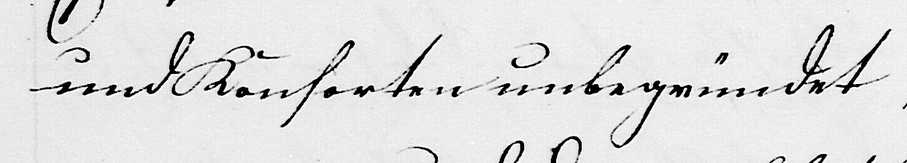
und Konsorten unbegründet,
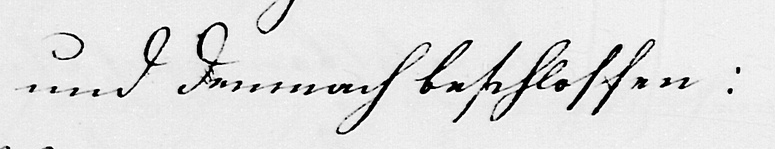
und demnach beschlossen:
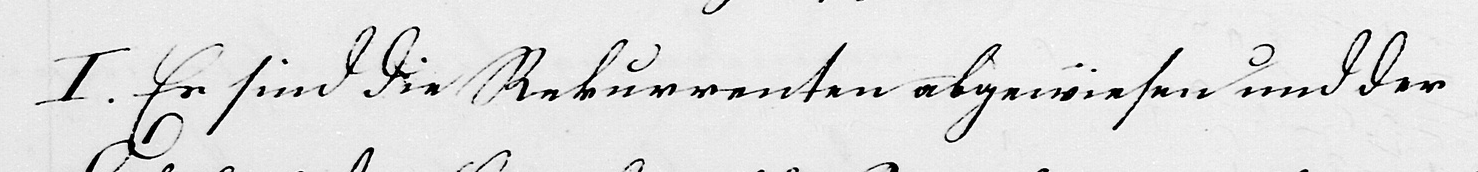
I. Es sind die Rekurrenten abgewiesen und der
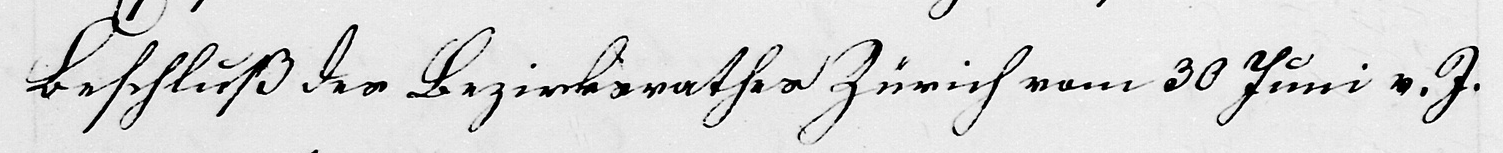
Beschluß des Bezirksrathes Zürich vom 30 Juni v. J.
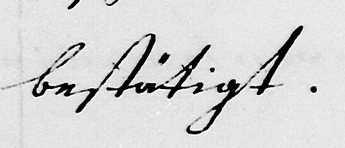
bestätigt.
